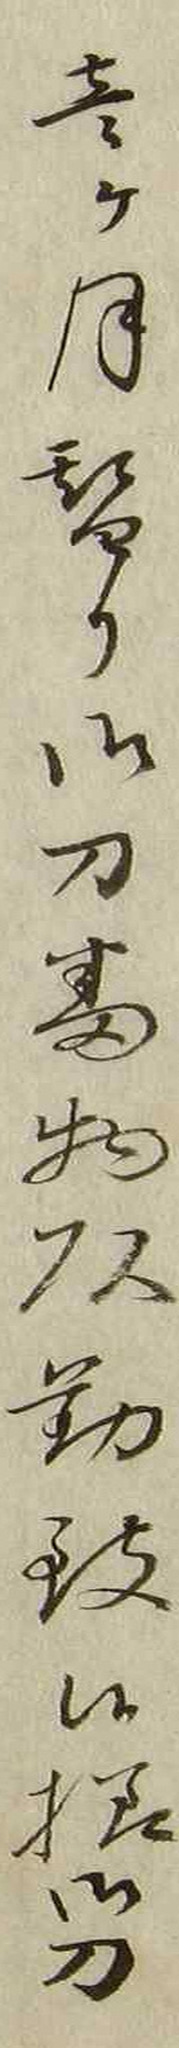壱ケ月替リ御刀番物頭勤め致し候様御刀
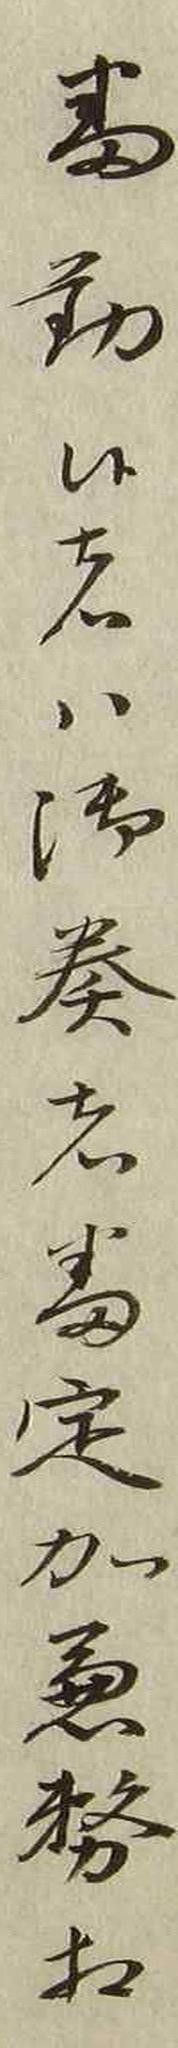番勤め候先ハ御奏者番定加兼務相
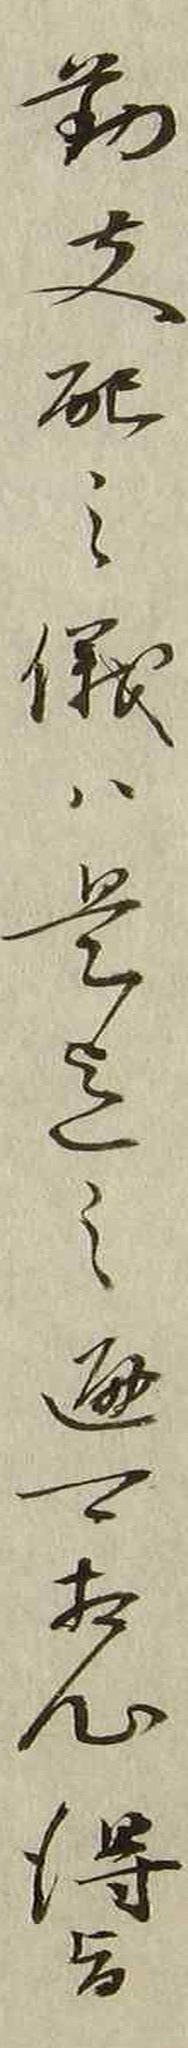勤め支配之儀ハ是迄之通り相心得候旨
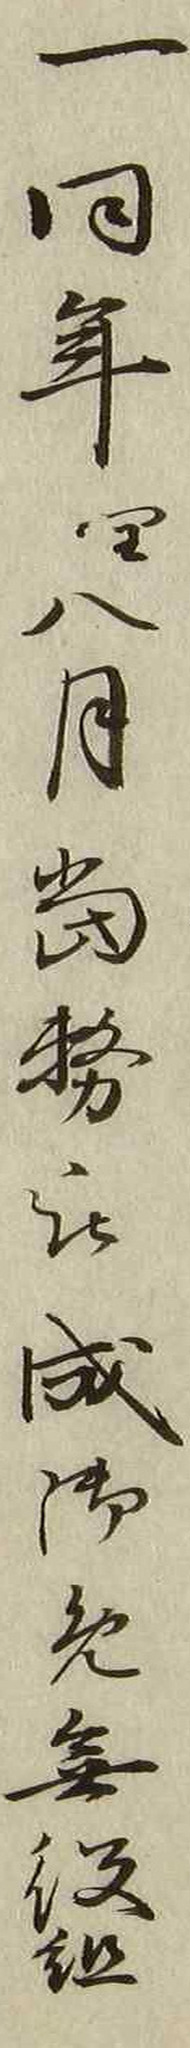一同年閏八月当努御免成られ無役組
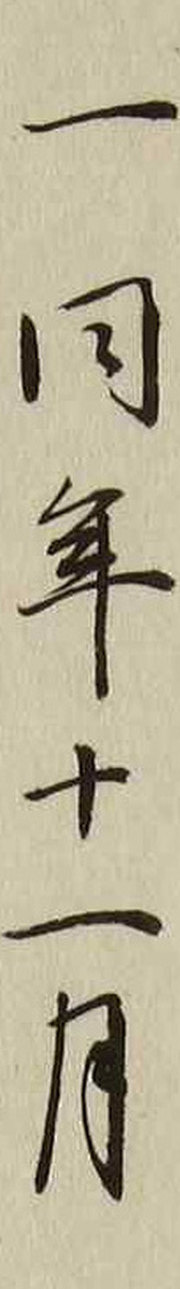一同年十一月
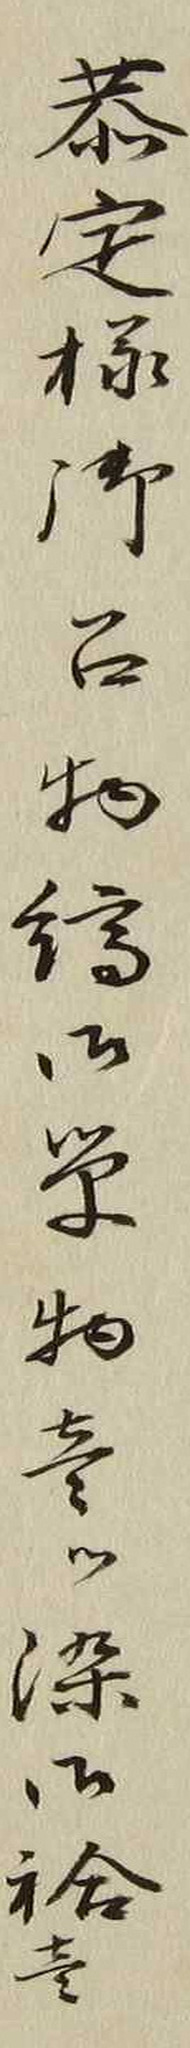恭定様御召し物縞御単物壱ッ染御袷壱
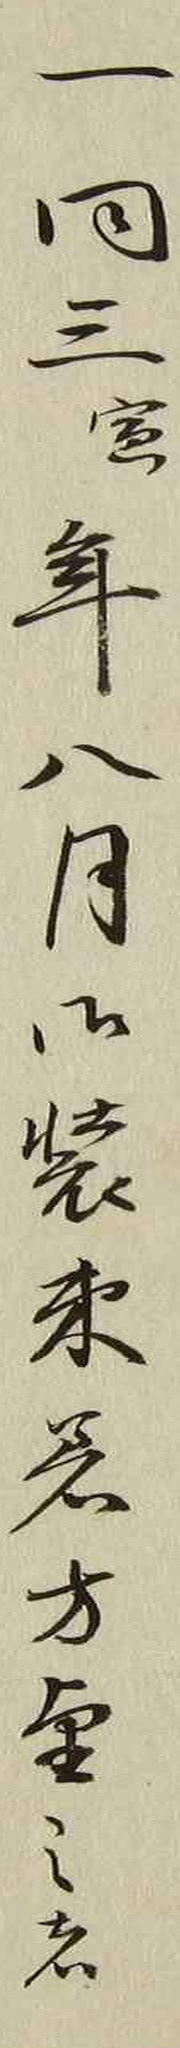一同三寅年八月御装束方望之者
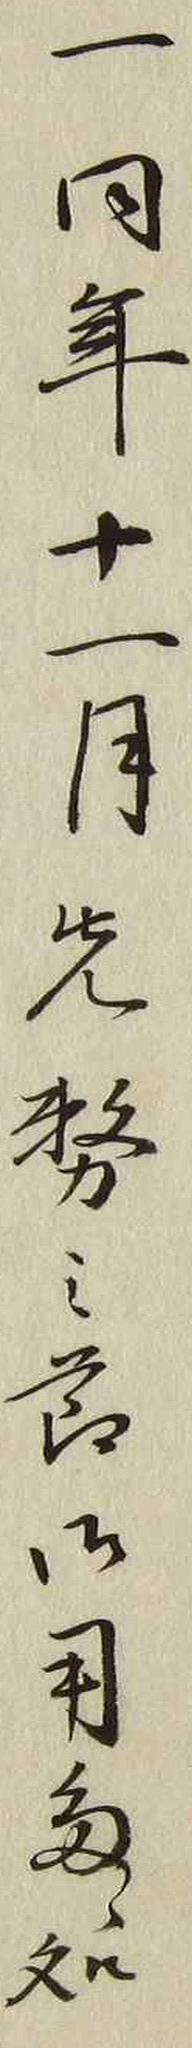一同年十一月先努之節御用番候処
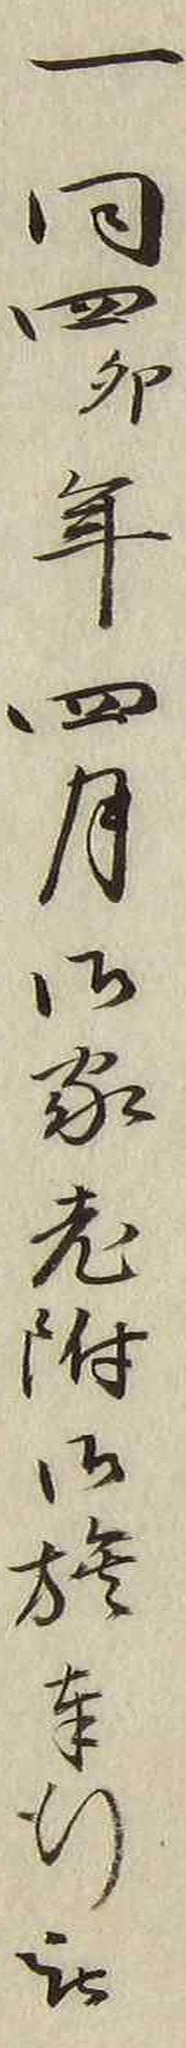一同四卯年四月御家老附き御旗奉行

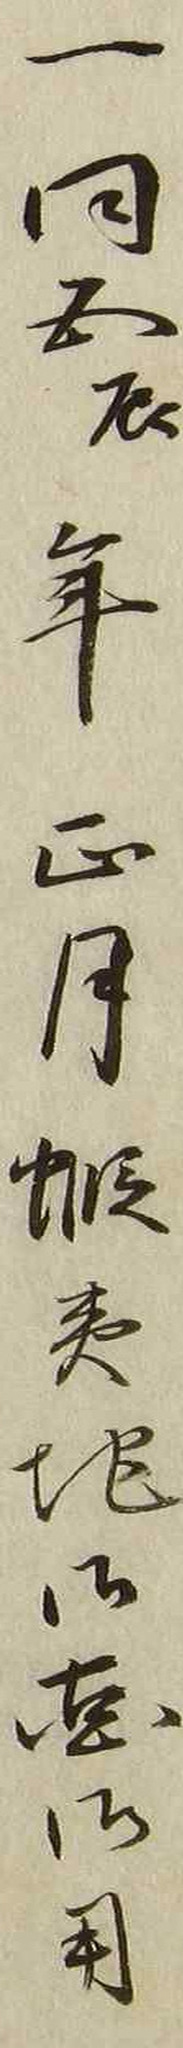一同五辰年正月蝦夷地御国御用
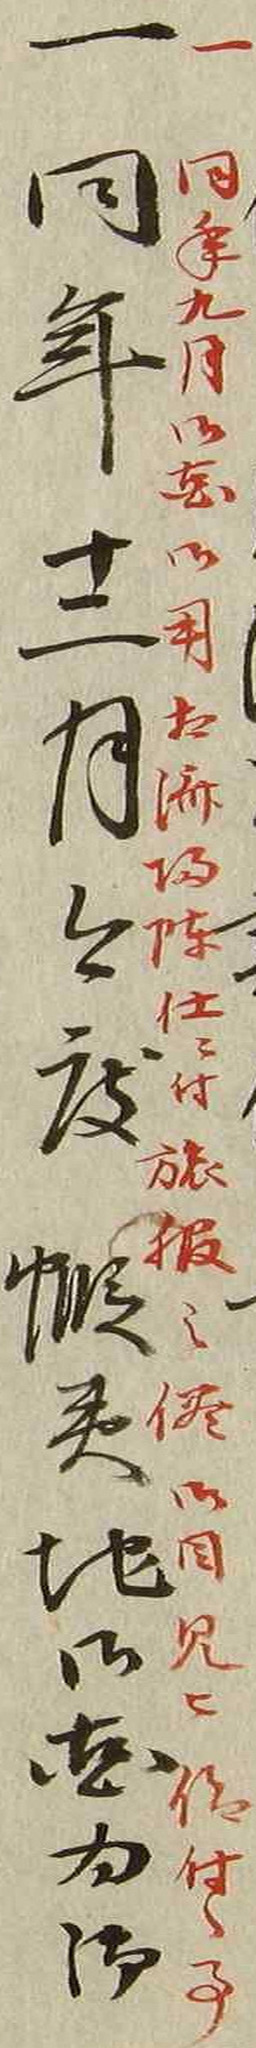同年十二月今度蝦夷地御国御
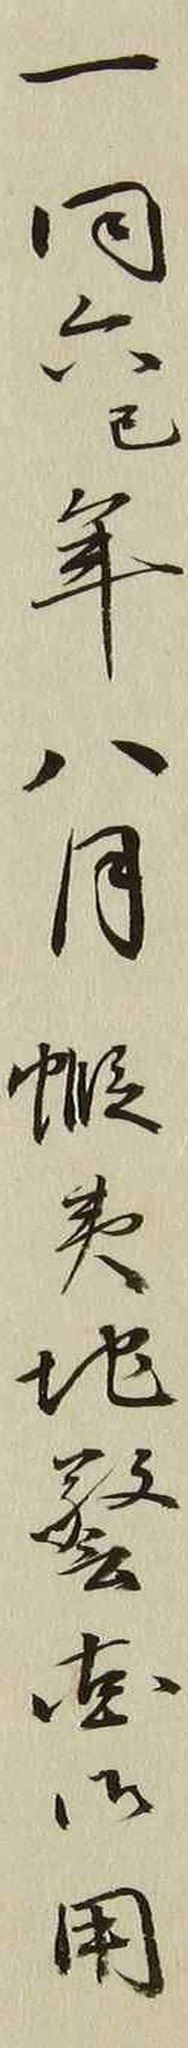一同六巳年八月蝦夷地警固御用
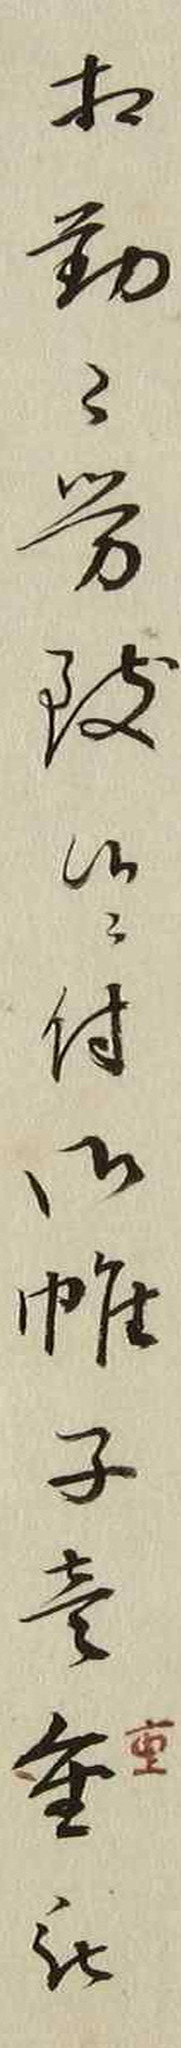相勤め候労致し候ニ付御帷子壱重
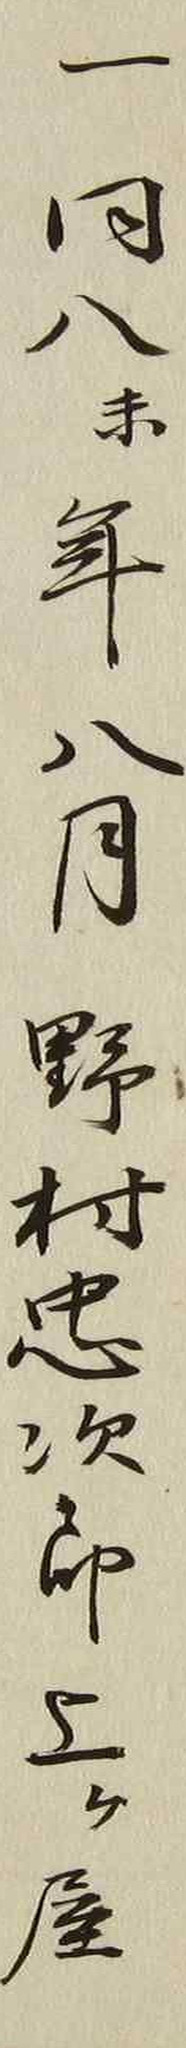一同八未年八野村忠次郎上ケ屋
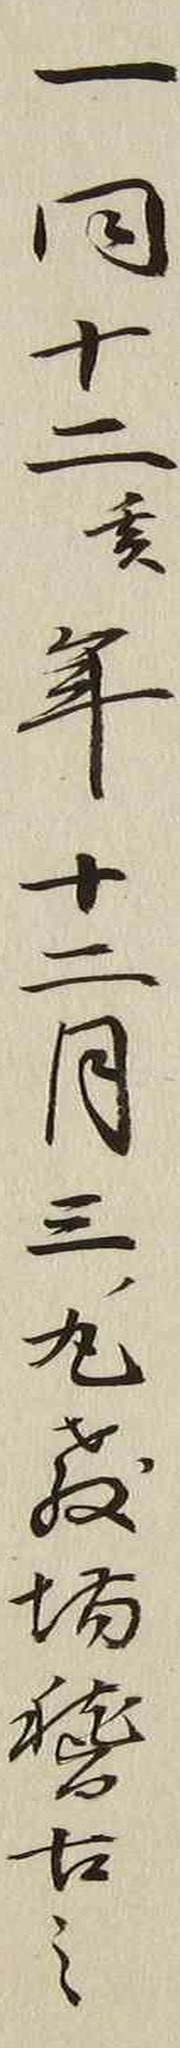一同十二亥年十二月三ノ丸教場稽古之
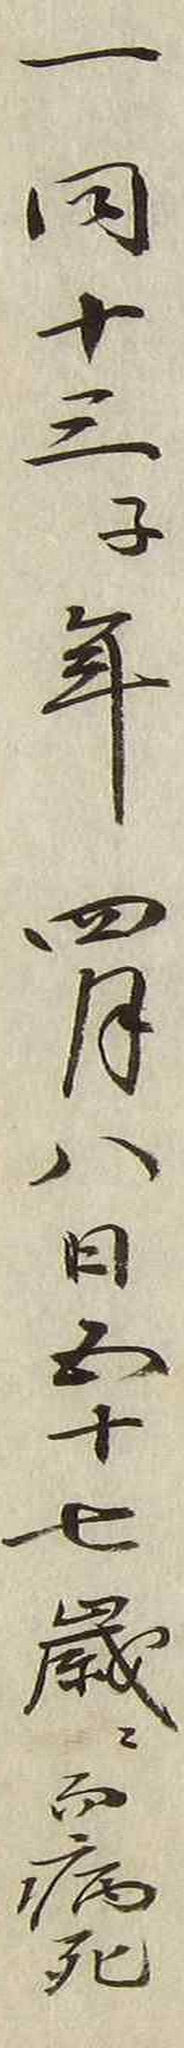一同十三子年四月八日五十七歳ニて病死
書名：諸士系譜　巻之19　い之部19
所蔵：会津若松市立会津図書館
